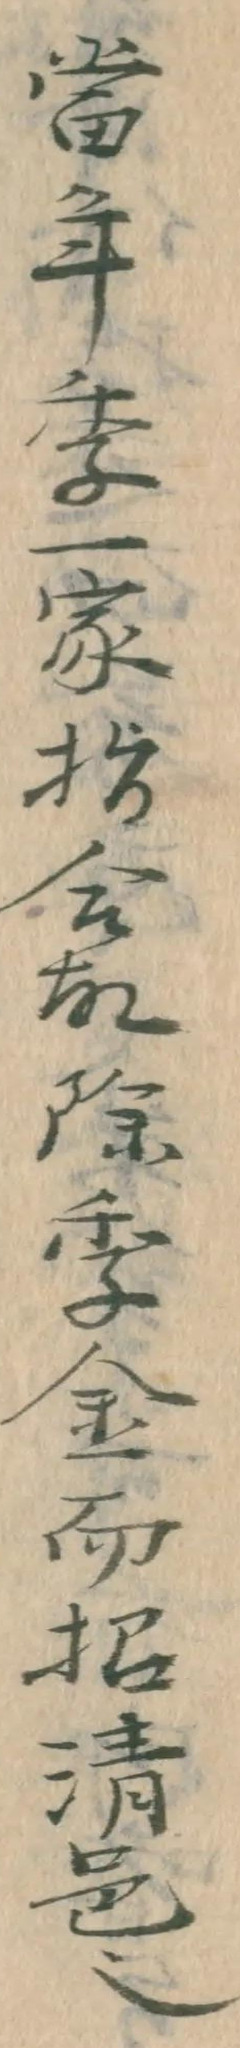当年季一家指合故除季金而招清邑也
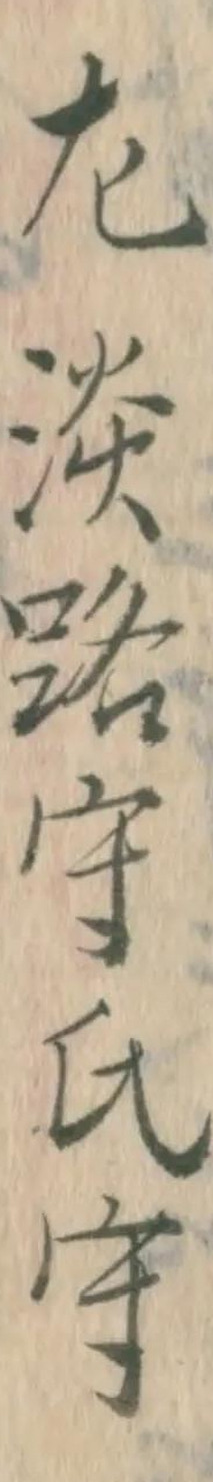左淡路守氏守
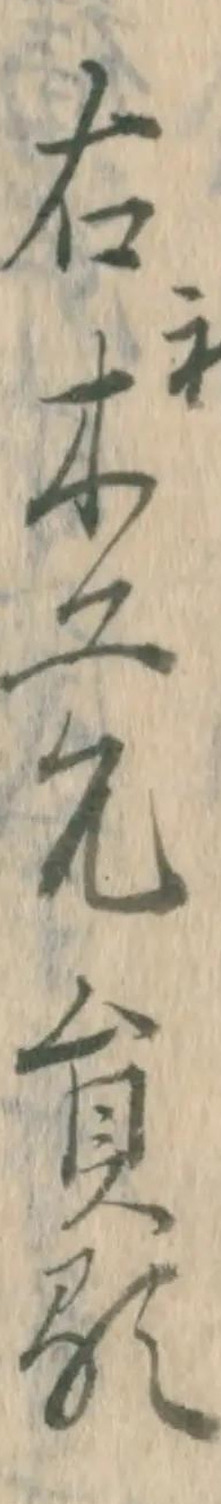右木工允員顕
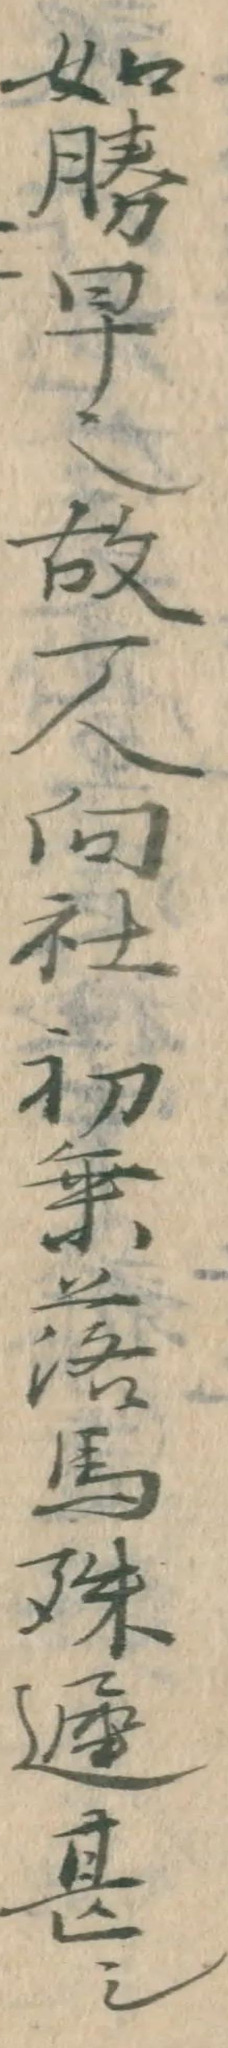如勝早也故一人向社初乗落馬殊遅甚シ
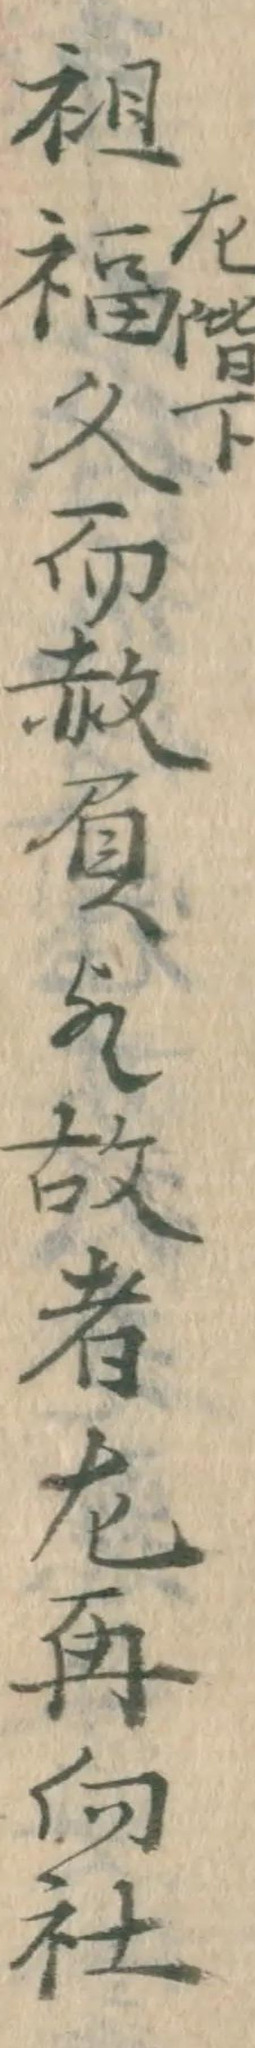祖福久而赦負歟故者左再向社
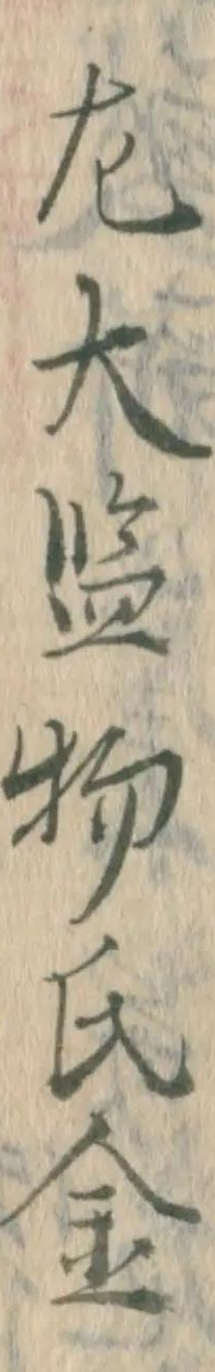左大監物氏金
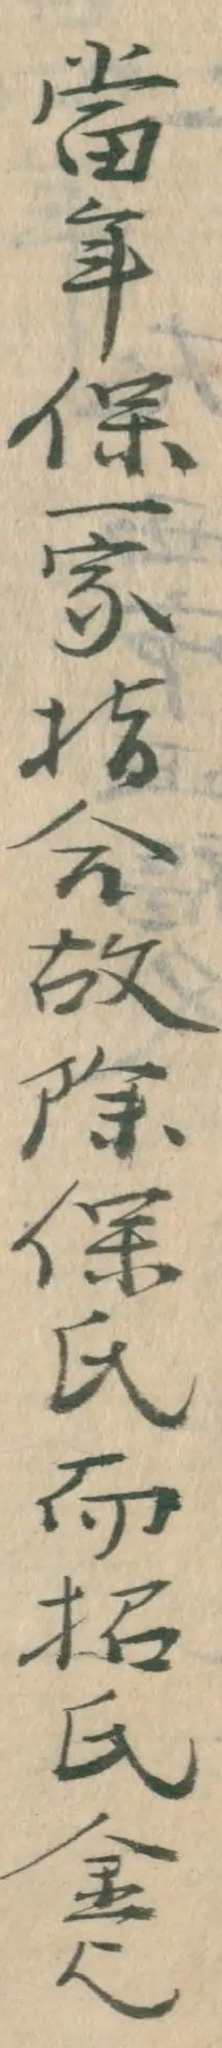當年保一家指合故除保氏而招氏金也

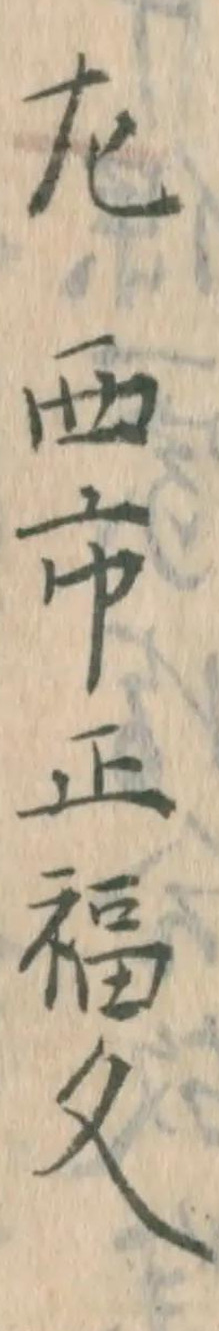左西市正福文
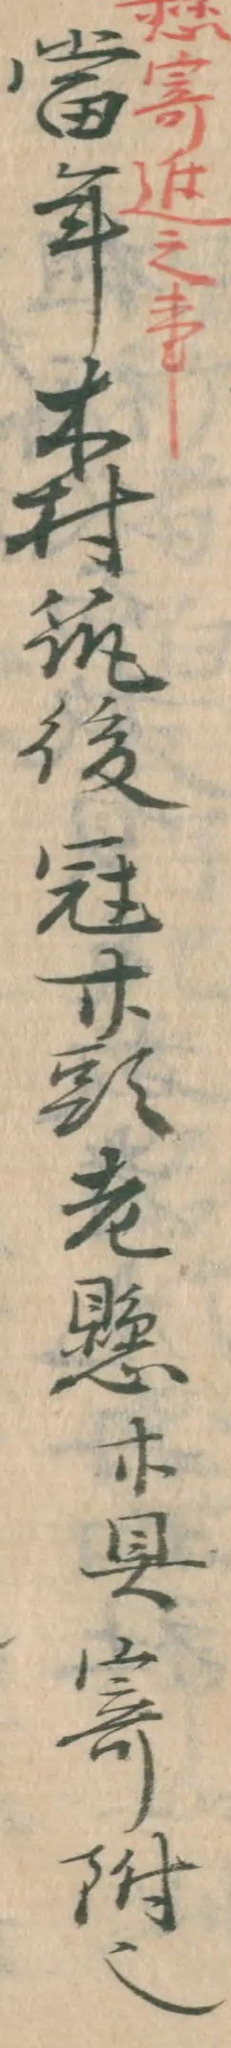当年木村筑後冠廿頭老懸廿具寄附也
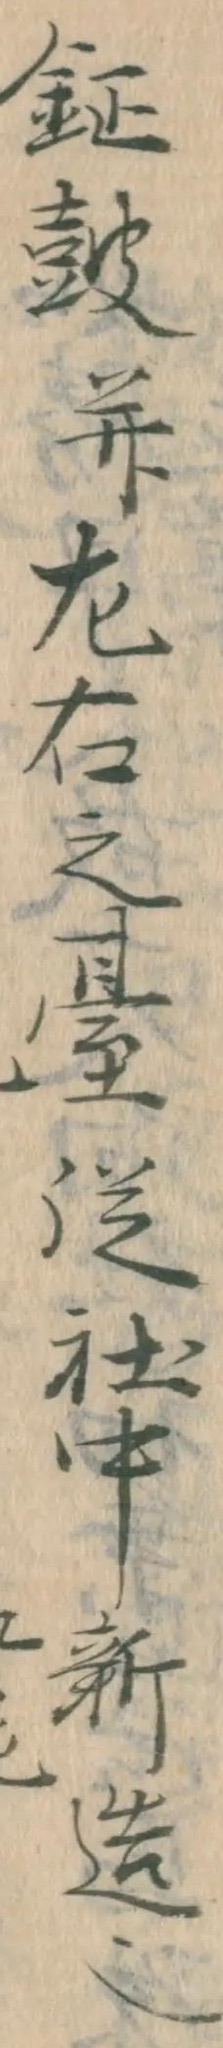鉦皷并左右之台従社中新造也
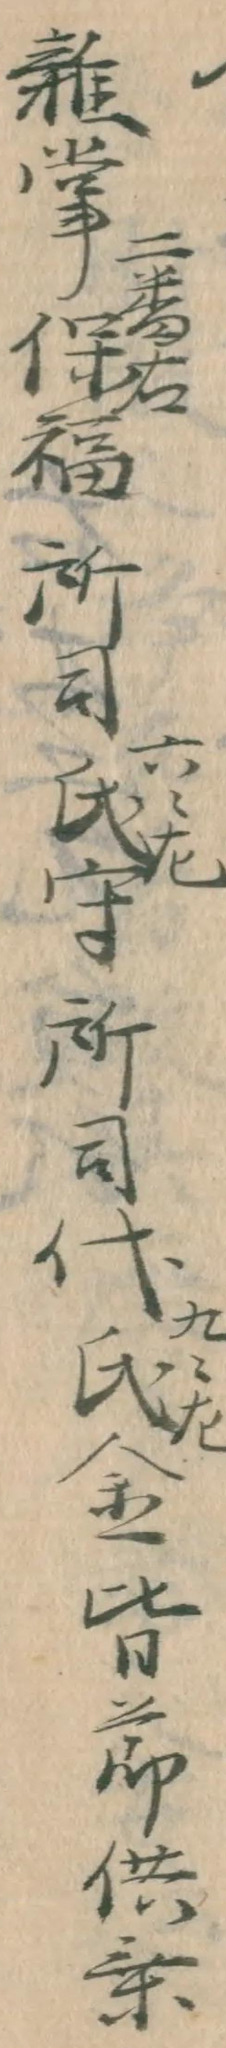雑掌保福所司氏守所司代氏金皆節供乗
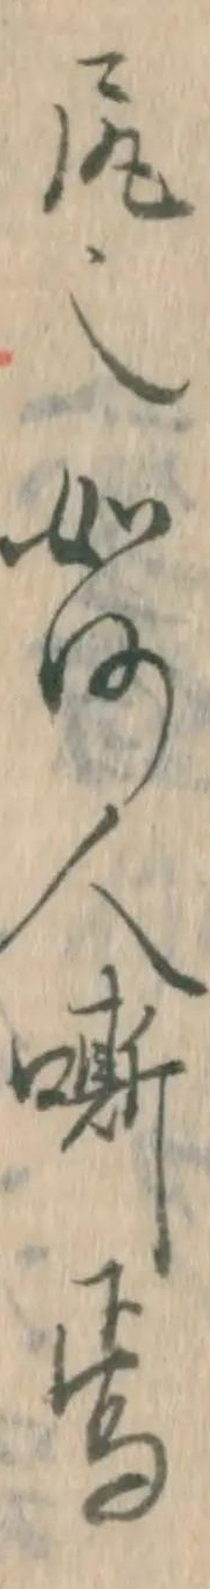尻也如何人噺焉
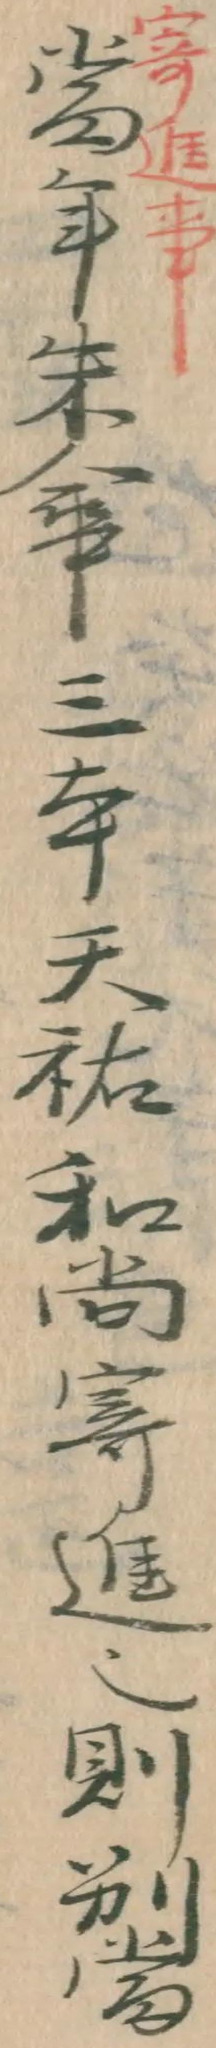当年朱傘三本天祐和尚寄進也則別当
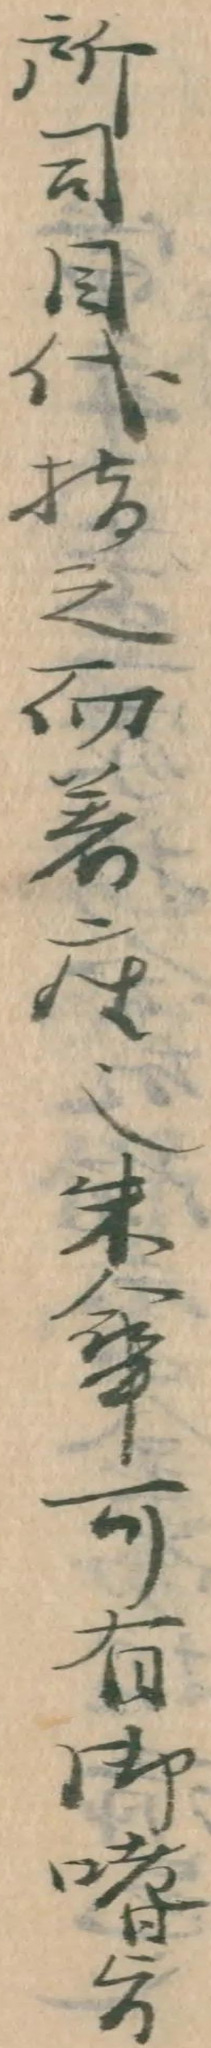所司目代指之而着座也朱傘可有御嗜旨
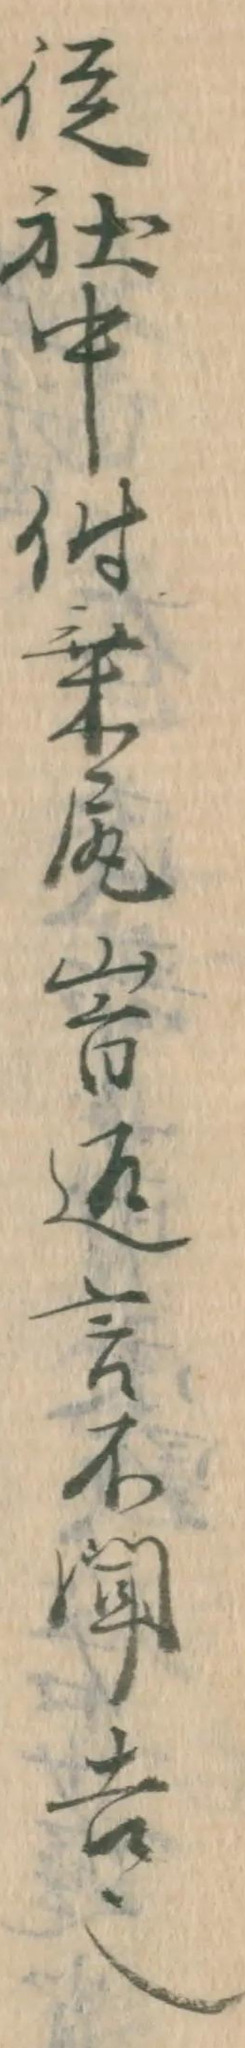従社中附乗尻旹返言不聞吉也
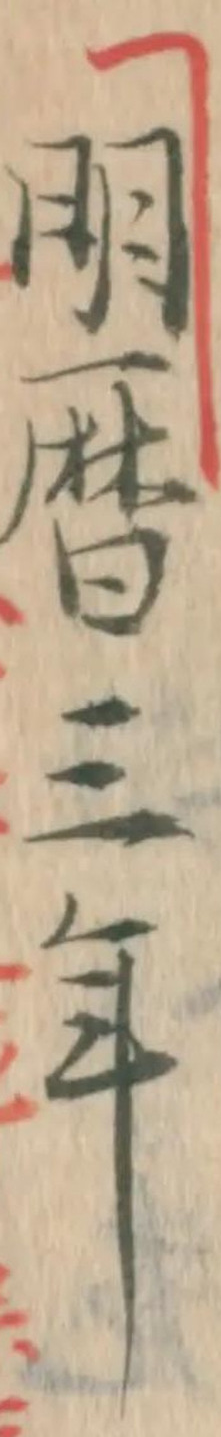明暦三年
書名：賀茂社記録. 第10冊
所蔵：国立国会図書館 National Diet Library, JAPAN
